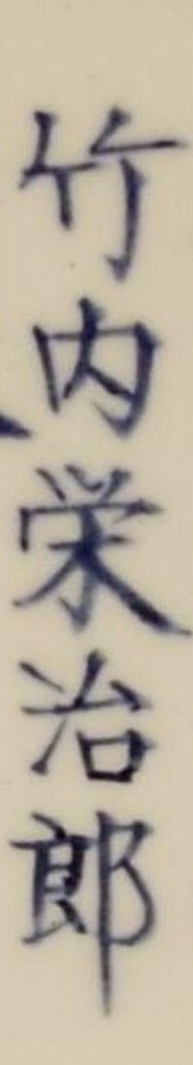竹内栄治郎
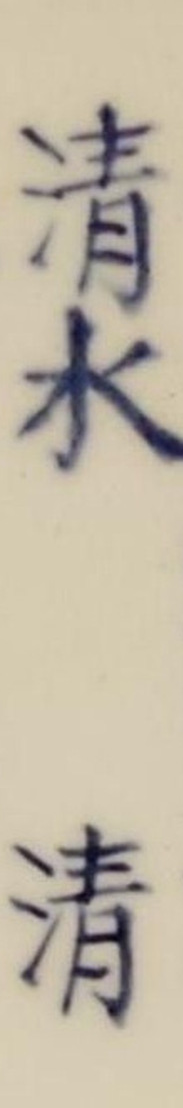清水清
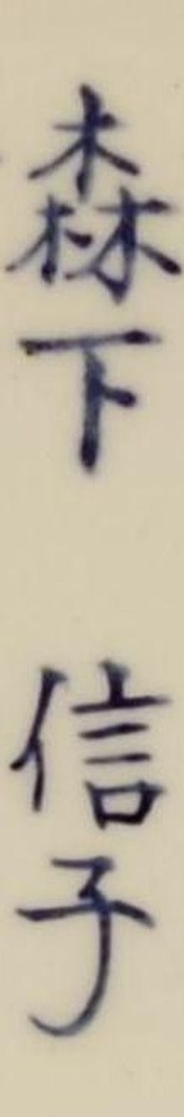森下信子
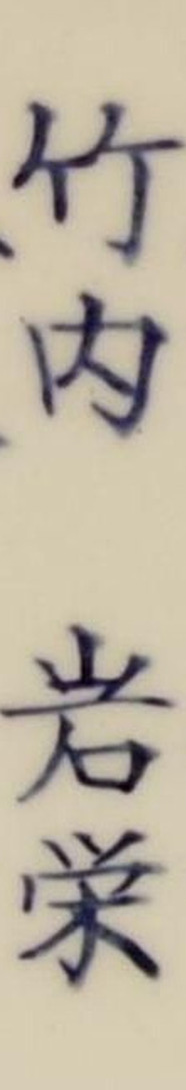竹内岩栄
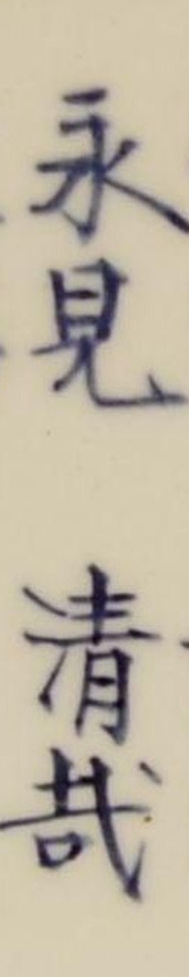永見清哉
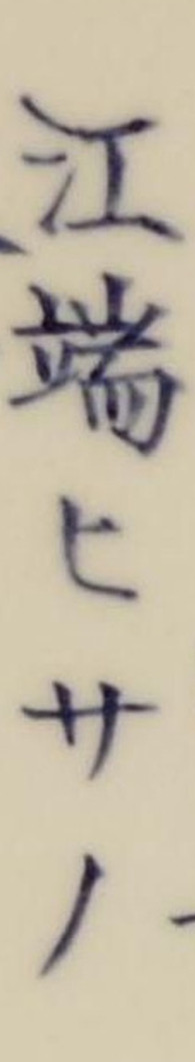江端ヒサノ
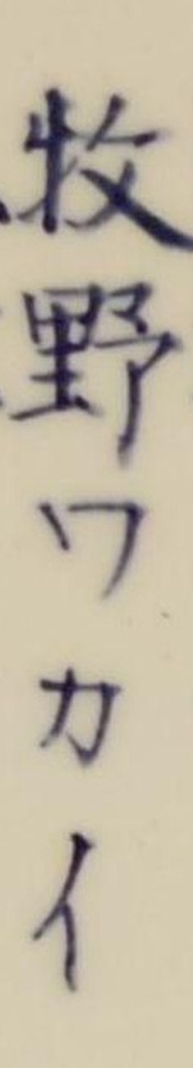牧野ワカイ
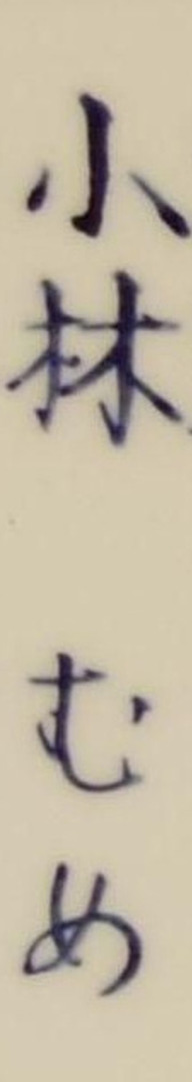小林むめ
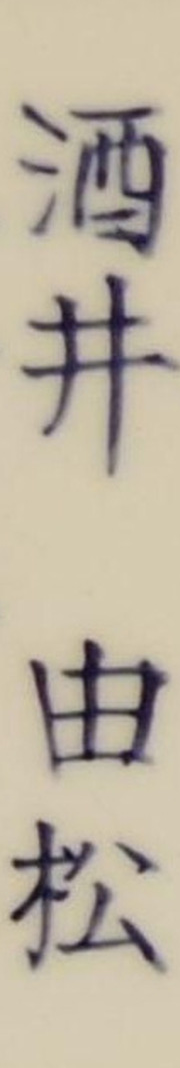酒井由松
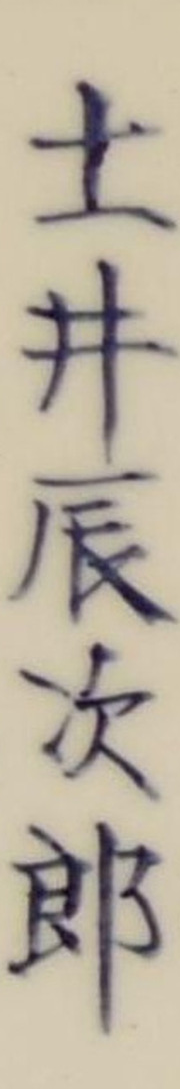土井辰次郎
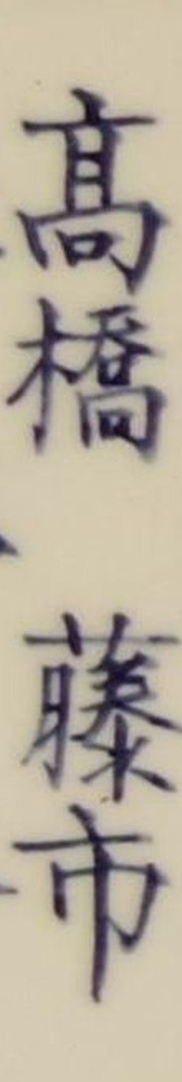高橋藤市
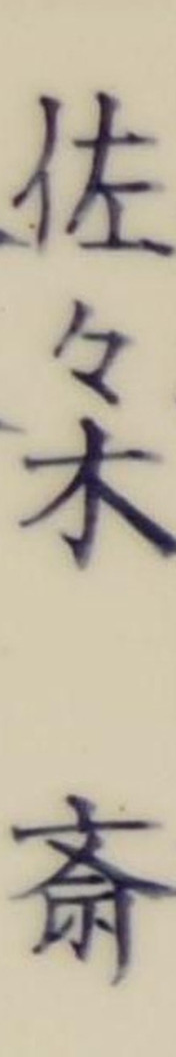佐々木斎
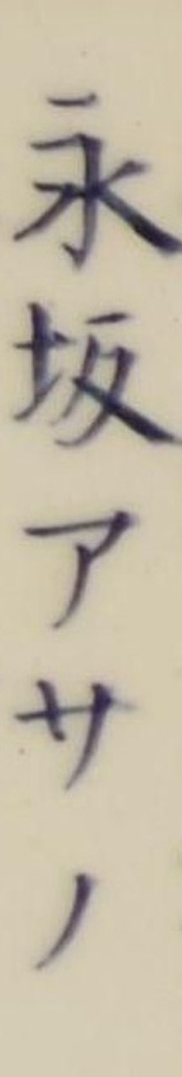永坂アサノ
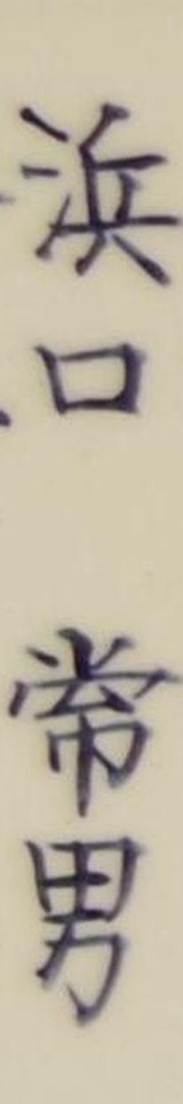浜口常男
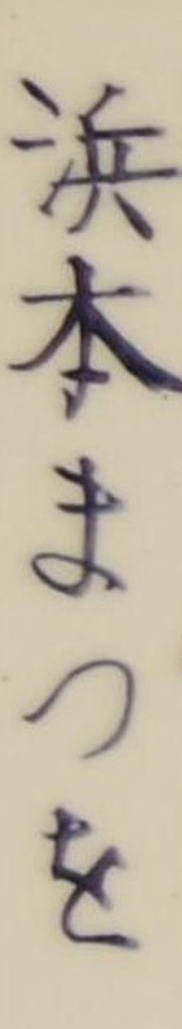浜本まつを

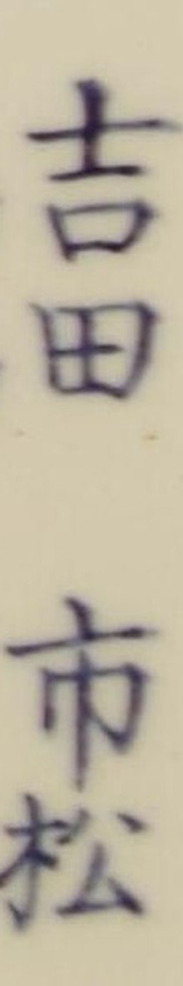吉田市松
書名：E~L
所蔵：高野山金剛峯寺
